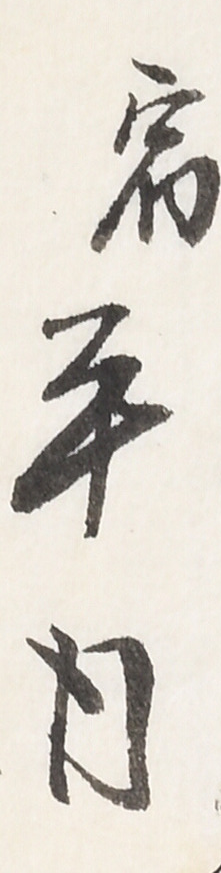宿平内
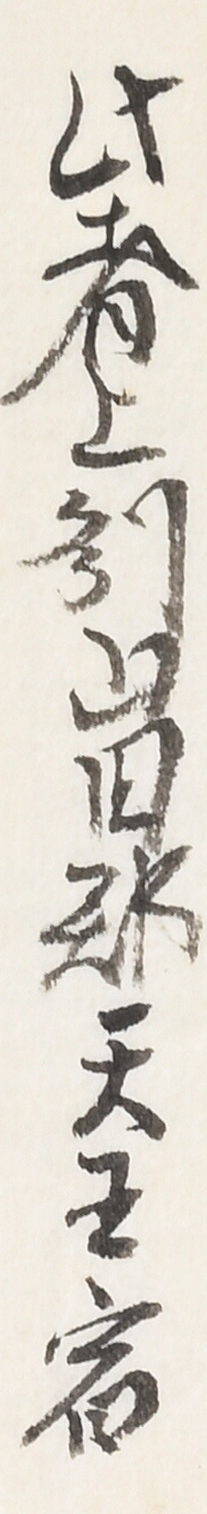此者上州山田郡天王宿
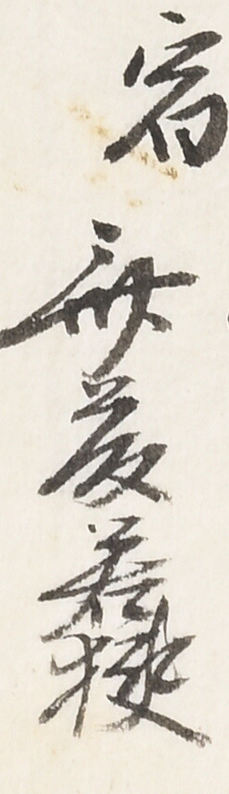宿無藤若狭
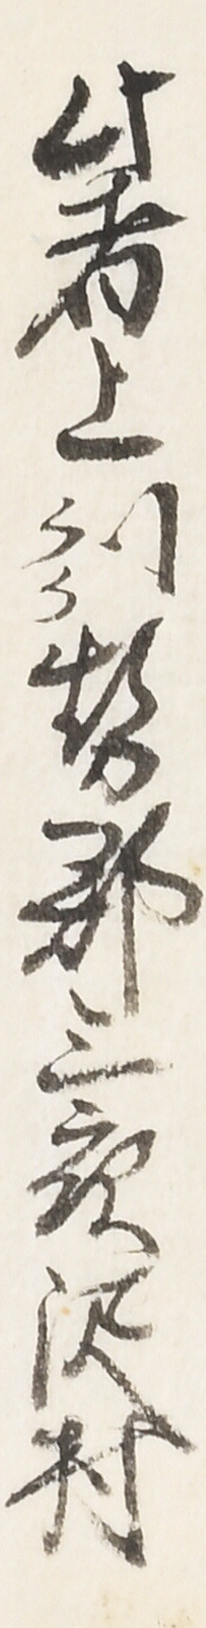此者上州勢郡三夜沢村
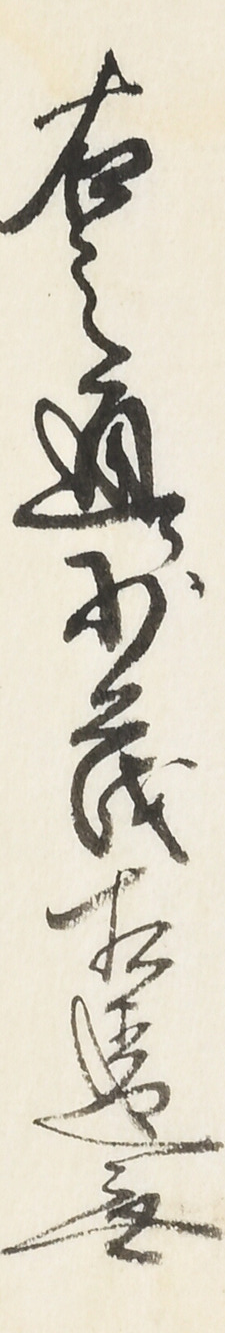右之通り少茂相違無
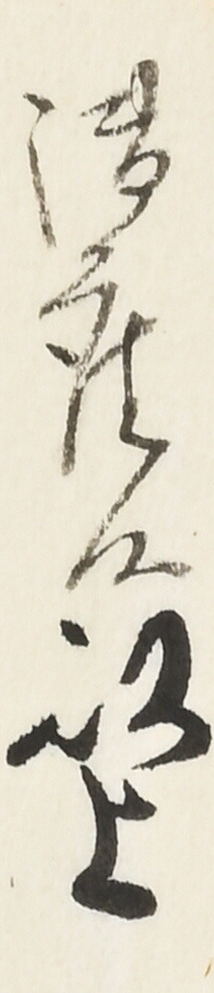御座候以上
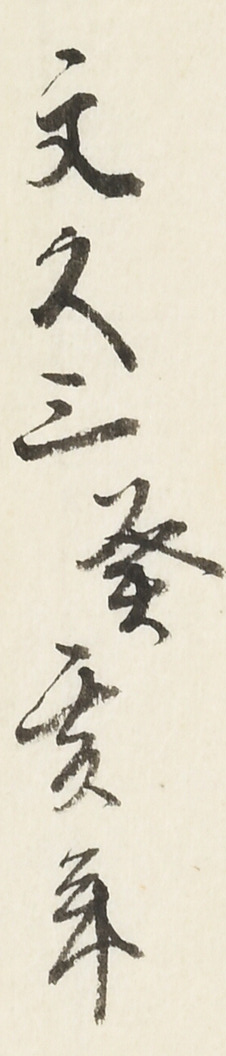文久三癸亥年

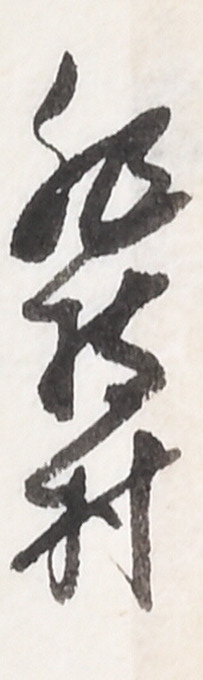非持村
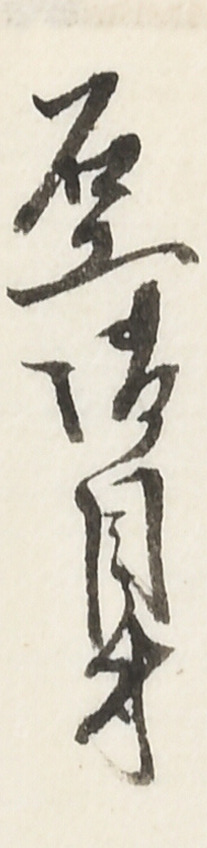石工御目付
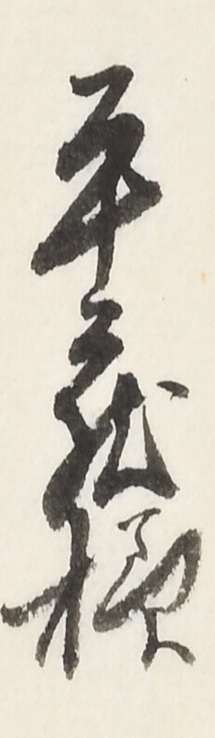平蔵様
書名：文久三癸亥年正月石切名前書上帳
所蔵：伊那市立高遠町図書館・合同会社AMANE
